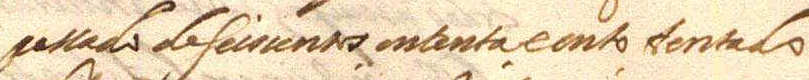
passado de seiscentos, outenta, e outo, tentado
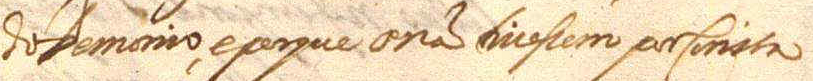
do Demonio, e porque o naõ tiuessem por Corista
